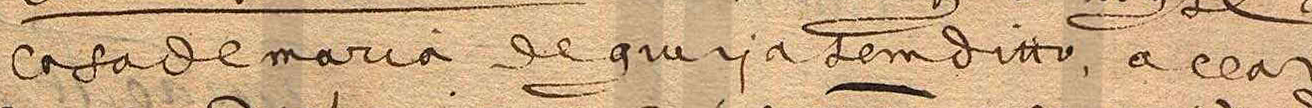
casa de maria de guerja tem ditto a cear
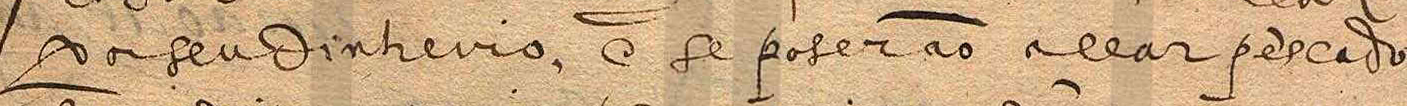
por seu dinheiro, e se poserão allar pescado
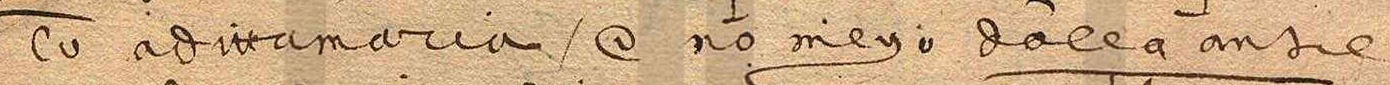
c̄o a ditta maria / e no meyo dalla antre
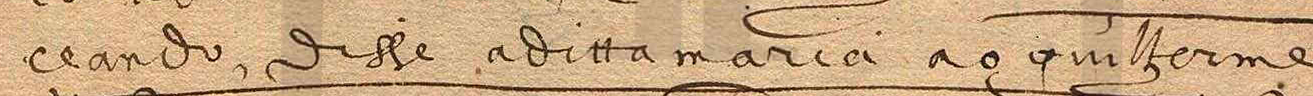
ceando, disse a ditta maria ao guilherme
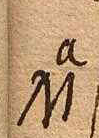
Ma
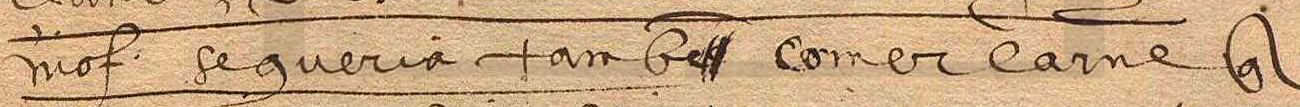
niof se queria tambē_ comer carne q̄
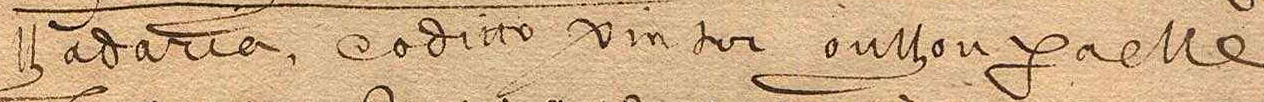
lha daria, e o ditto pintor oulhou ꝑa elle
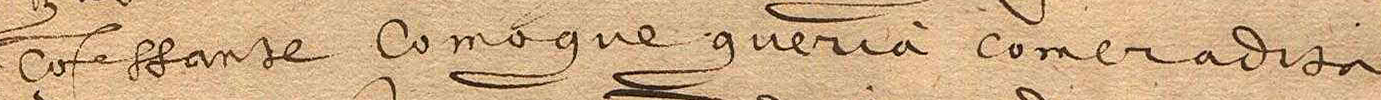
cōfessante como que queria comer a dita
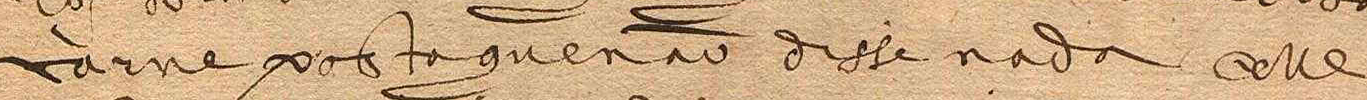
carne posta que não disse nada e elle
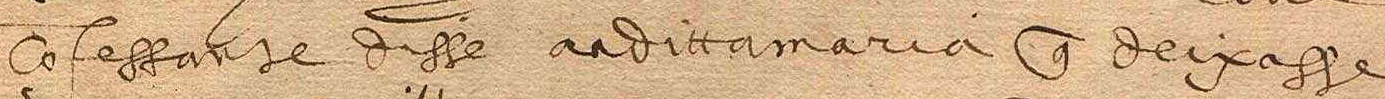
c̄ofessante disse a ditta maria q̄ deixasse
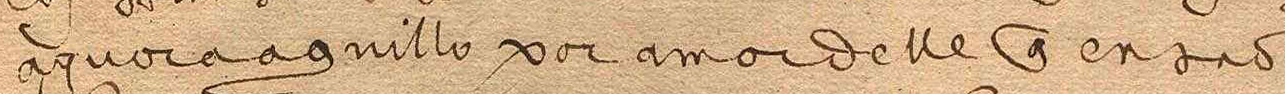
aguora aquillo por amor delle q̄ entaõ
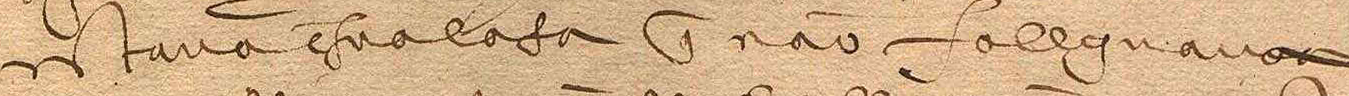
estaua ē sua casa q̄ não follguaua
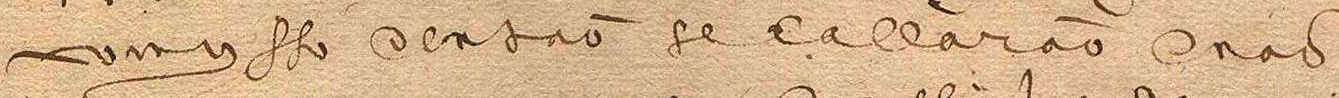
com ysso e entaõ se callaraõ e naõ
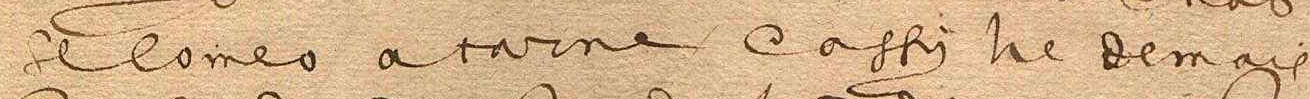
se comeo a carne e assy he de mais
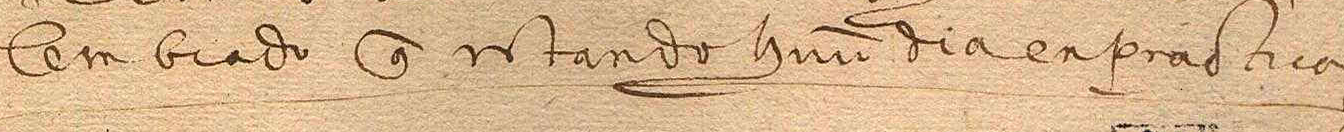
lembrado q̄ estando huū dia en practica
